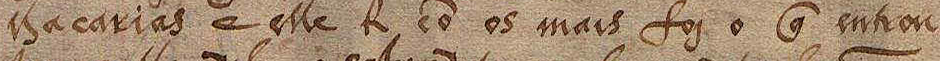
lhacarias e elle R cō os mais foj o q̄ entrou
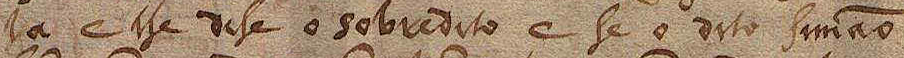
la e lhe dise o sobredito e se o dito Simão
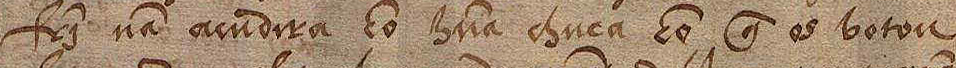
frz̄ nā acudira cō hūa chuca cō q̄ os botou
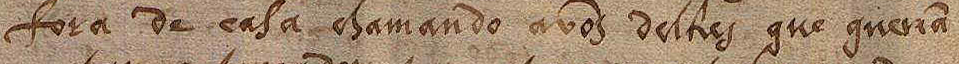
fora de casa chamando a vōs del Rej que queriā
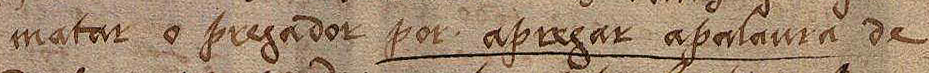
matar o pregador por apregar a palaura de
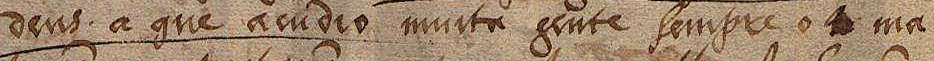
deus. a que acudio muita gente sempre o _ ma
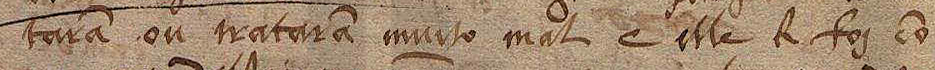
tarā ou tratarā muito maL e elle R foj cō
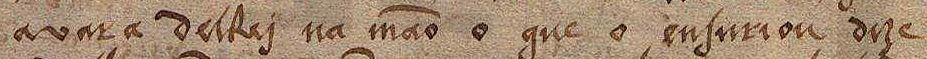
a vara del Rej na maõ o que o enjuriou dize
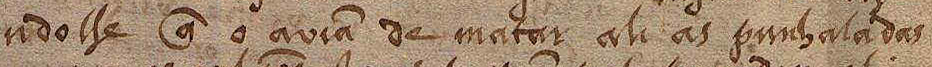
ndolhe q̄ o aviā de matar ali as punhaladas
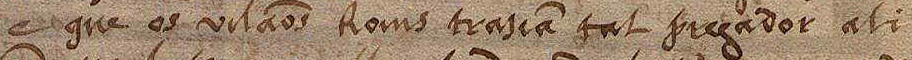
e que os vilãos Roins trasiā tal pregador ali
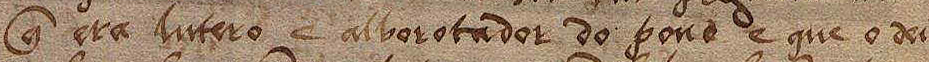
q̄ era lutero e alborotador do pouo e que o dei
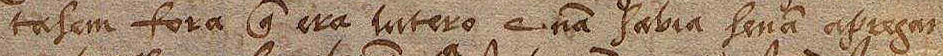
tasem fora q̄ era lutero e nā sabia senā apregar
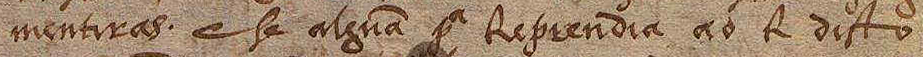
mentiras. e se algūa pa Reprendia ao R disto
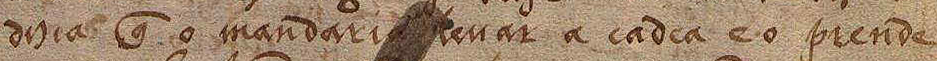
dizia q̄ o mandaria leuar a cadea e o prende
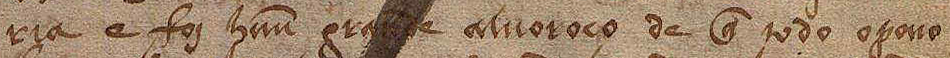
ria e foj huū grande aluoroço de q̄ todo o pouo
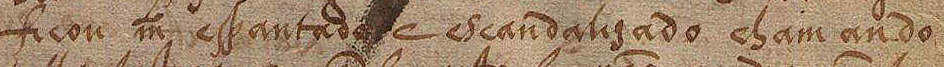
ficou mto espantado e escandalizado chamando
